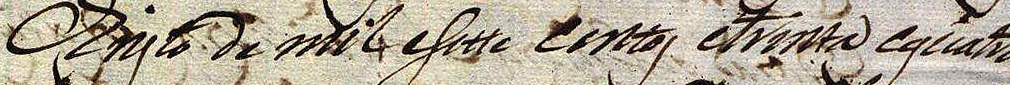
Christo de mil e settecentos e trinta e quatro
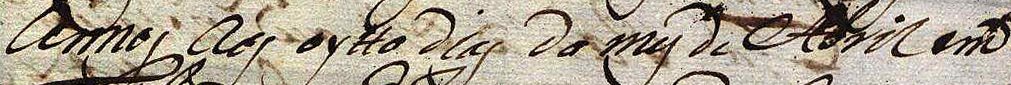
Annos aos oytto dias do mes de Abril em
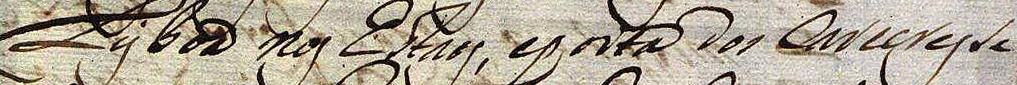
Lisboa nos Estaos, e porta dos Carceres se
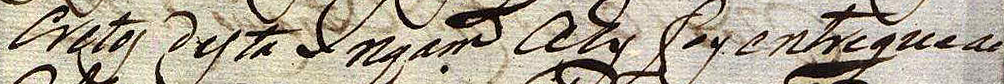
cretos desta Inqam Ahy foy entregue ao
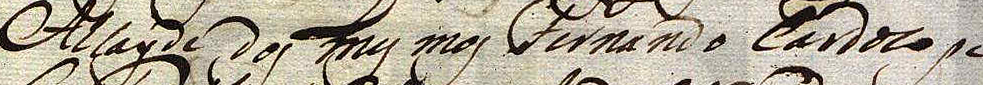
Alcayde dos mesmos Fernando Cardozo pe
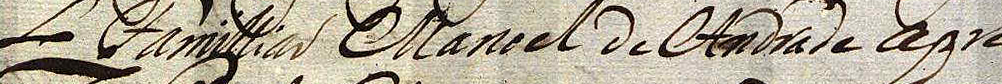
lo Familliar Manoel de Andrade a pre
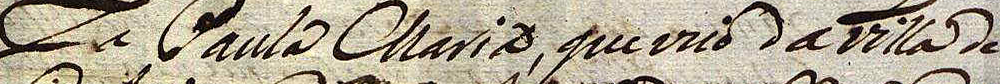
Za Paula Maria, que veio da villa de
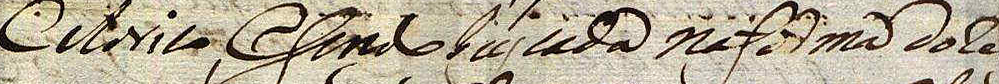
Celorico, e sendo buscada na forma do Re
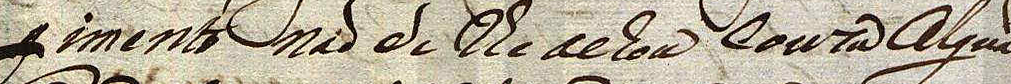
gimento naõ se lhe achou Couza Alguā
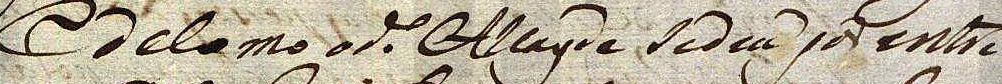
E declamo o d.o Alcayde se deu por entre
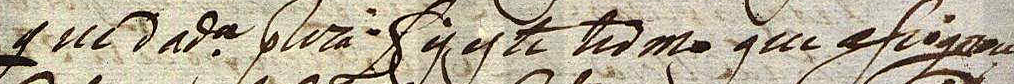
gue da d.a pReza fis este termo que assignou
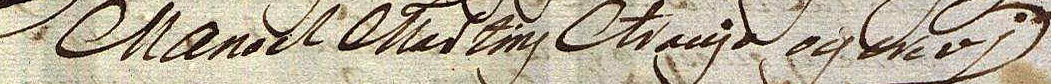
Manoel Martins Araujo o escrevi
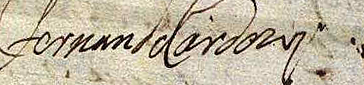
Fernando Cardozo.
